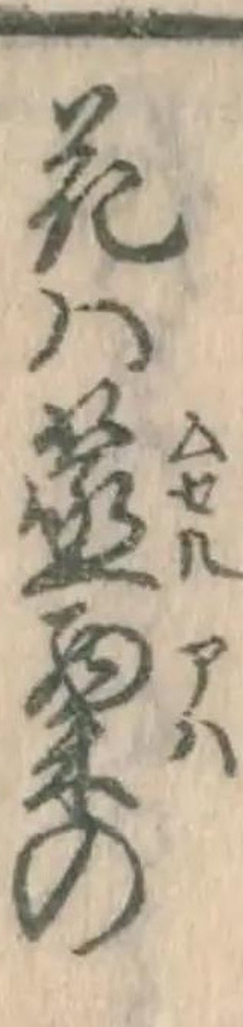花は蒸粟の
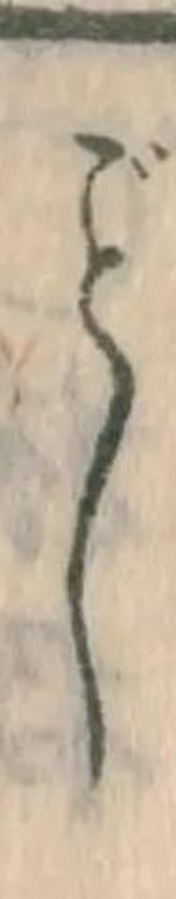ごとし
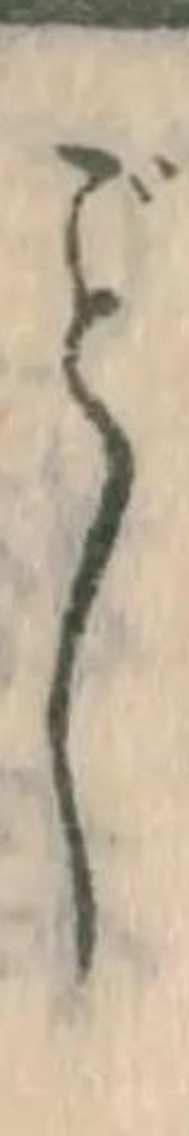ごとし
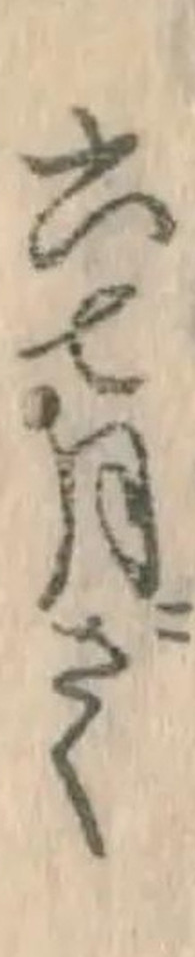六七月にさく
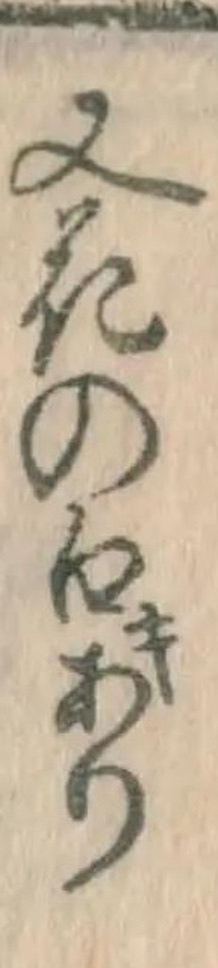又花の白きあり
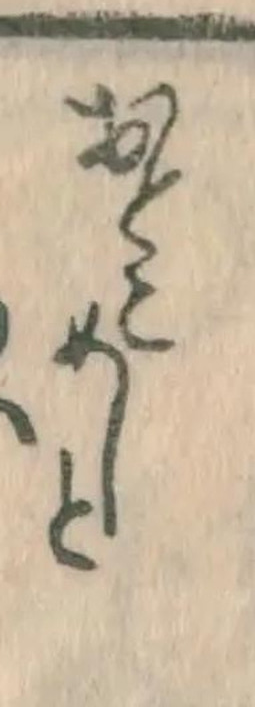おとこめしと
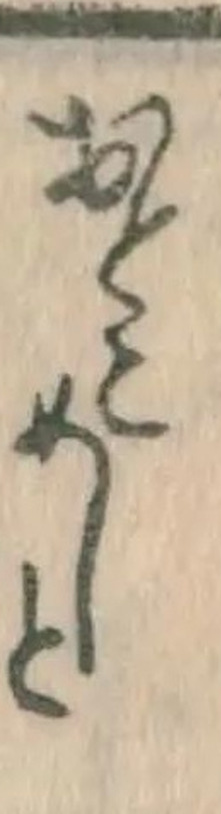おとこめしと
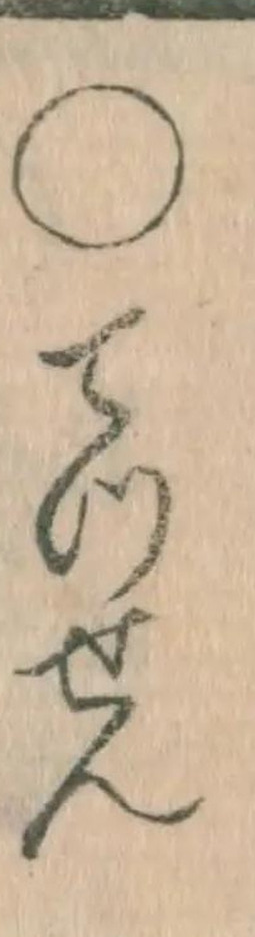〇てつせん
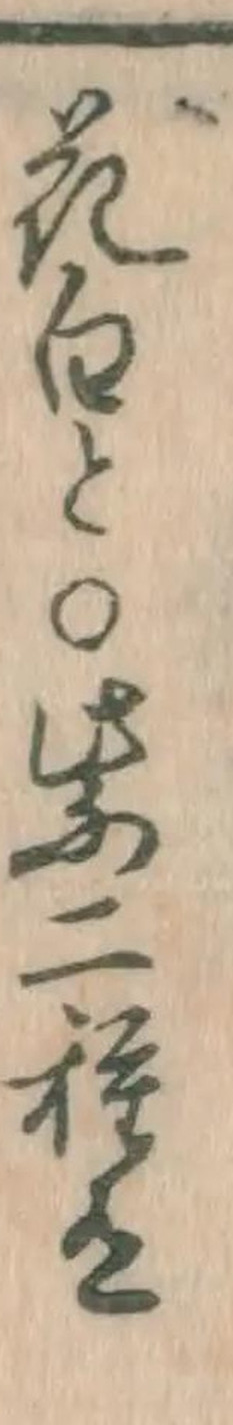花白〇と紫二種有
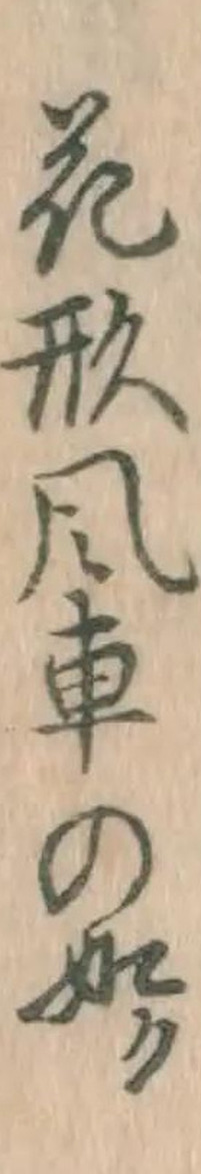花形風車の如く
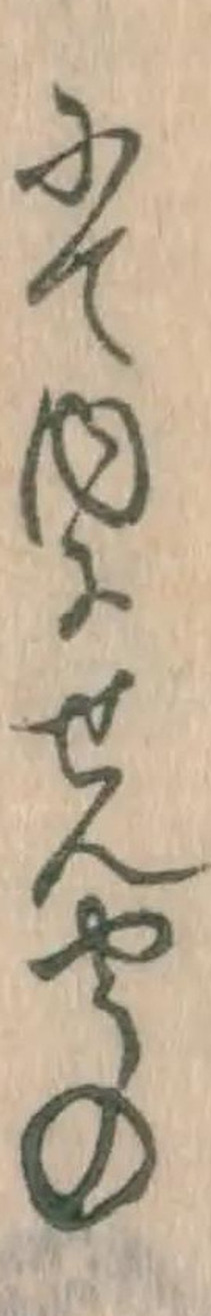にて内にせんやうの
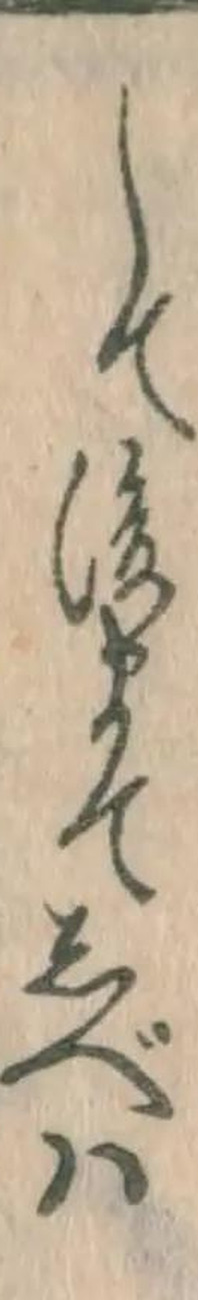して後にてしべは
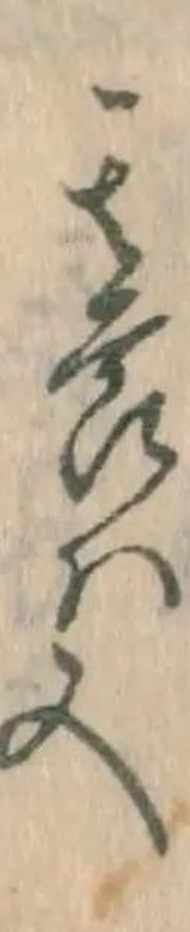其節は又
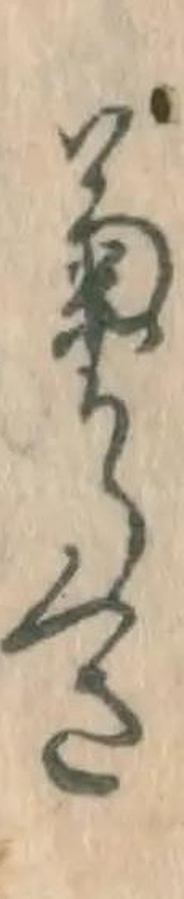菊からくさ
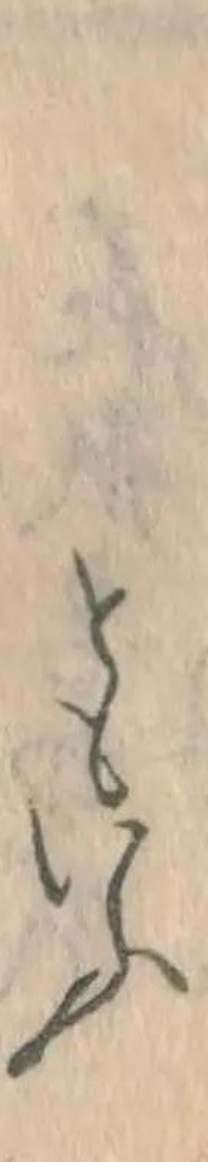ともいふ
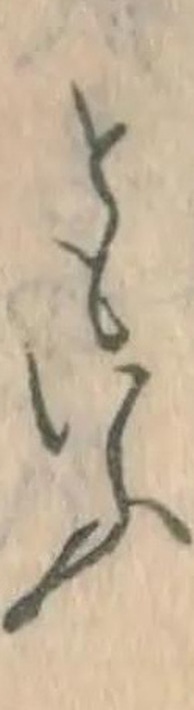ともいふ
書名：艸花繪前集. [3]
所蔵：国立国会図書館 National Diet Library, JAPAN
